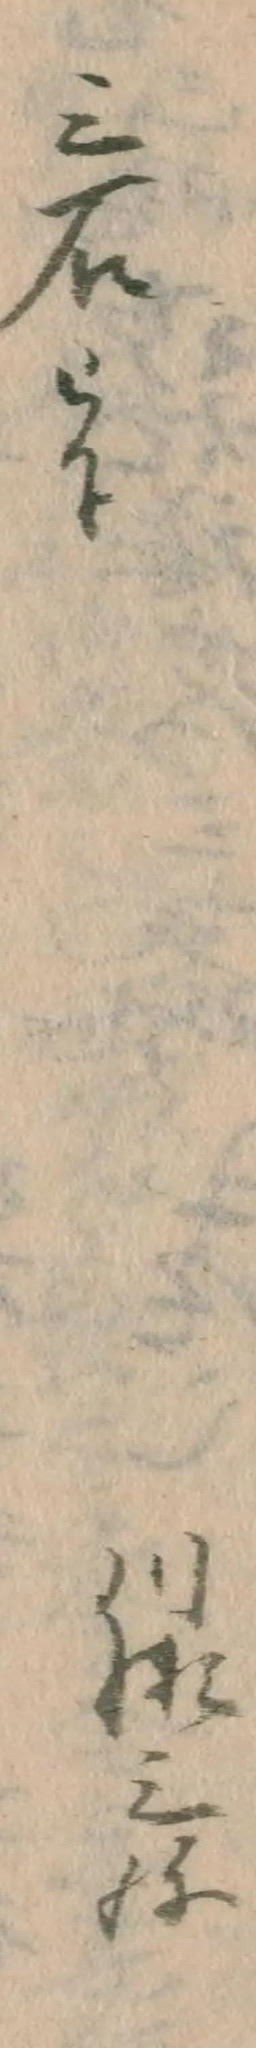三石被下川瀬三好
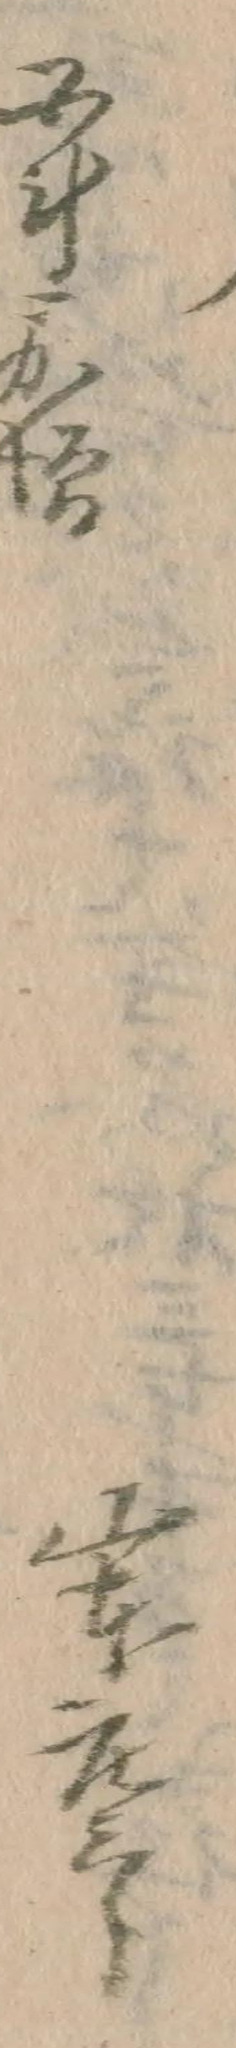五斗御加増山本庄三郎
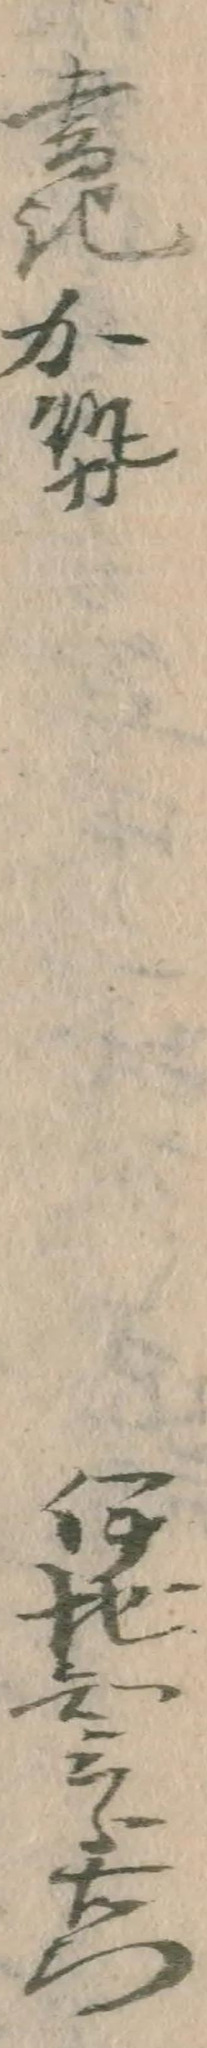書記加勢伊地知三郎右衛門
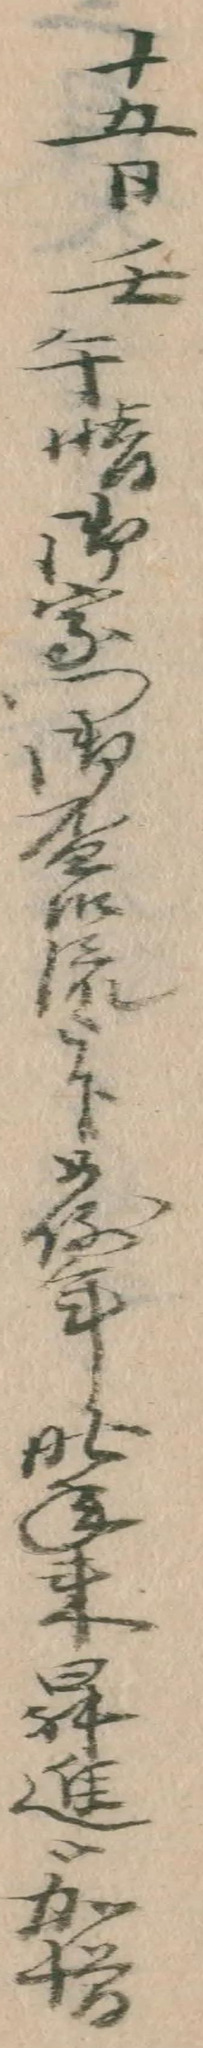十五日壬午晴御家門御盃御流被下如例年昨年来昇進御加増
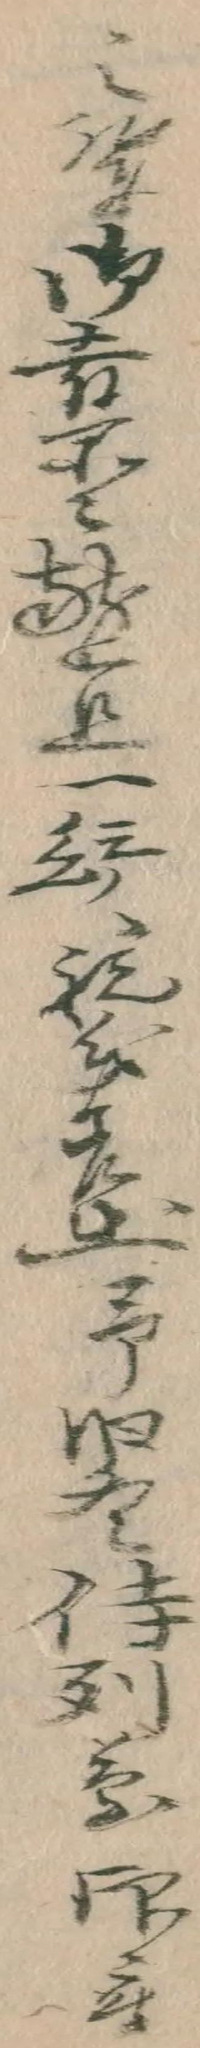之輩御肴所々献上且一統ヘ祝義差出予旧冬待列蒙仰ニ付
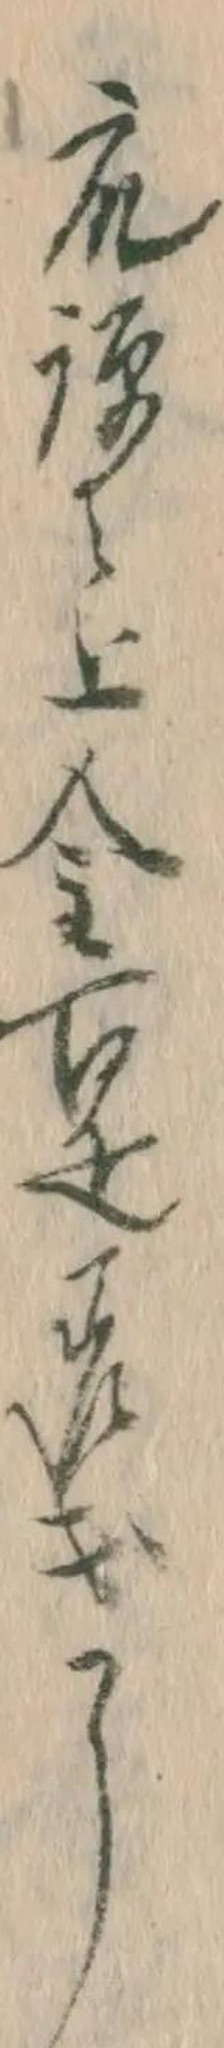衆評之上金百疋差出了
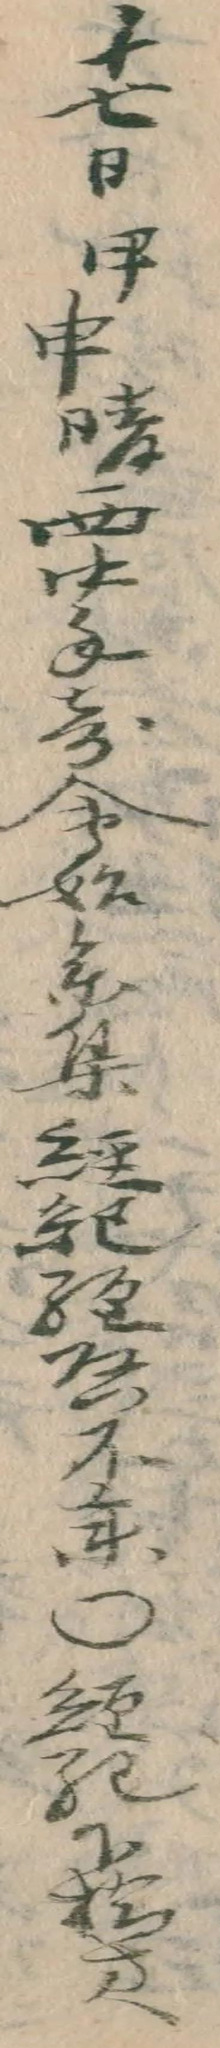十七日甲申晴西中手寄會始参集経紀経啓不参○経紀下橋方へ
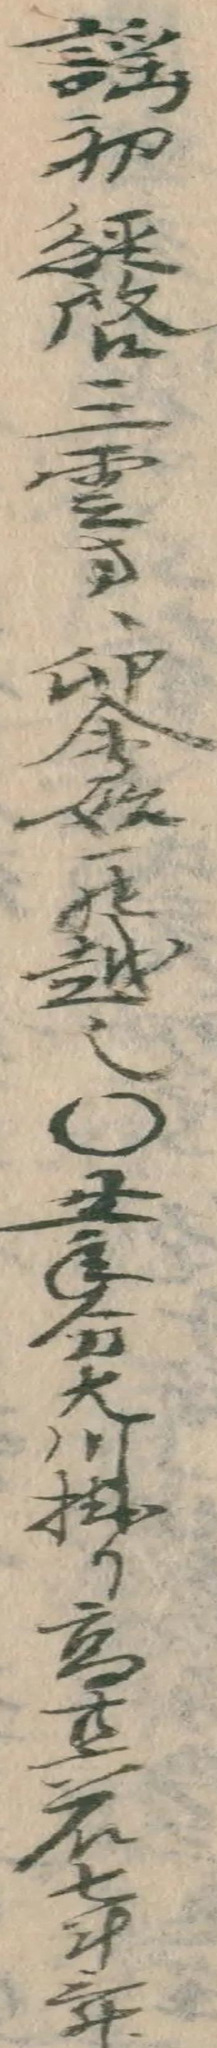謡初経啓三雲方ヘ卯會始罷越也○丑年分大川掛り高其石七斗三升
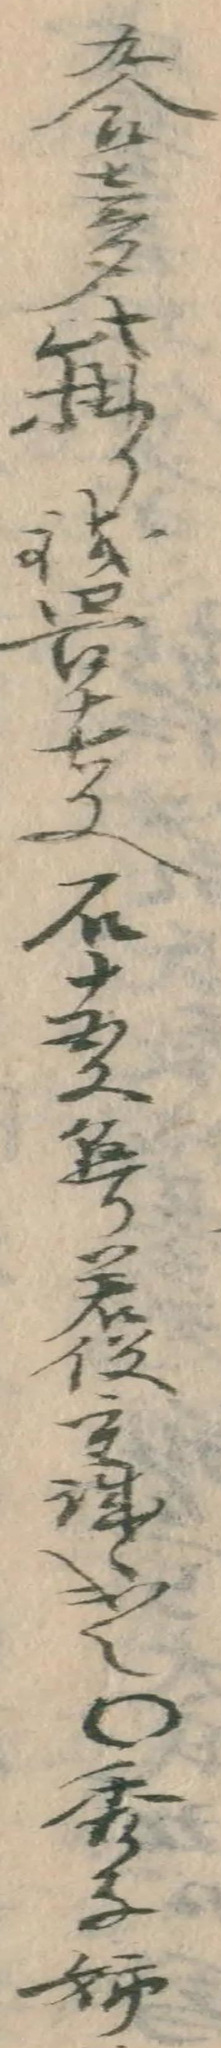九合壱勺此掛り銭四百十七文石十五文懸り若役主許へ出也〇秀子姉
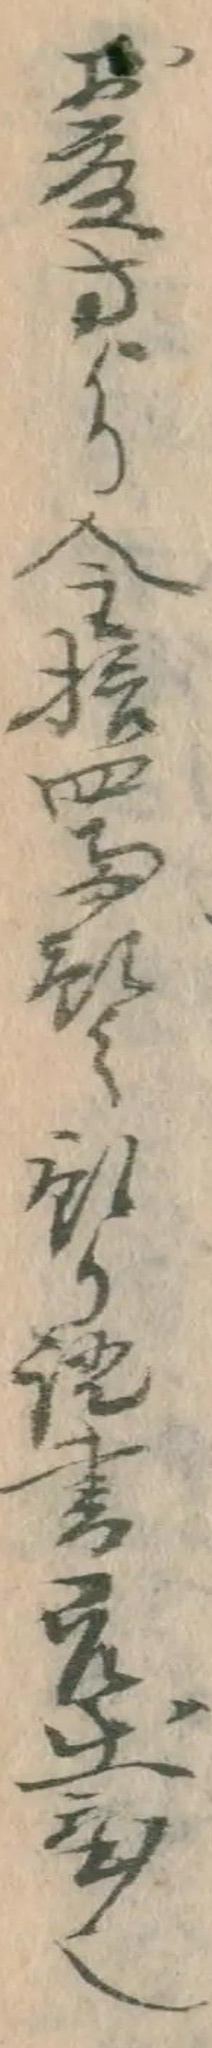御藤方より金拾四両預之預り證書差出置也

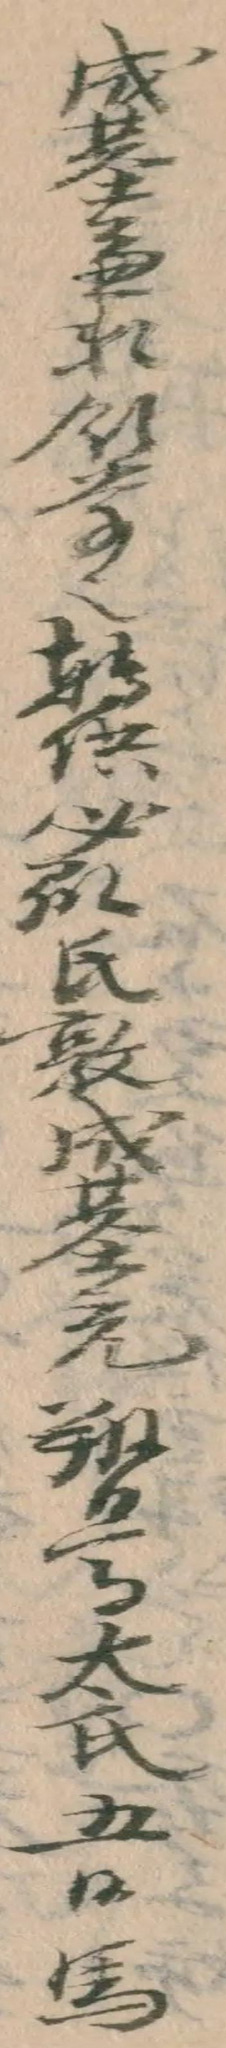成基兼頼領掌也轉供必顕氏敦成基充朔日馬太氏五日馬
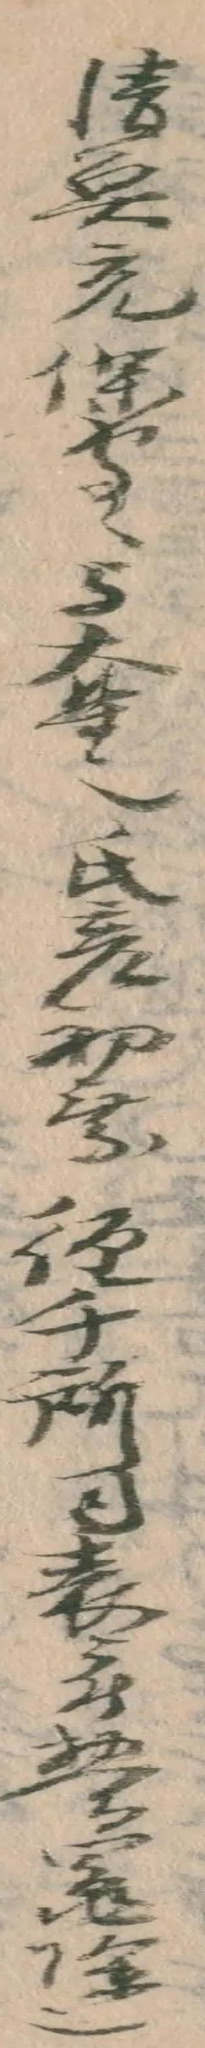清魚充保守へ与奪也氏彦初乗経千所司表ニ付惣而鬮除也
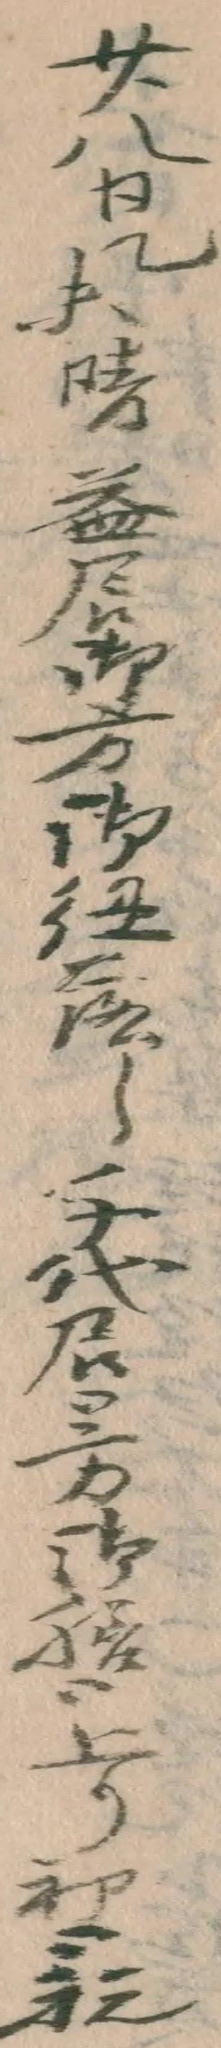廿八日乙未晴益君御方御組落し千代君御方御膳御上り初御祝
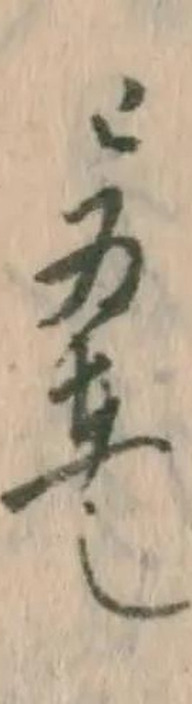被為在也
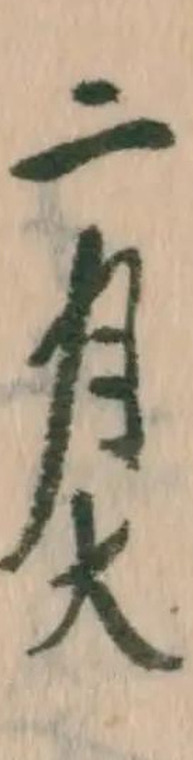二月大
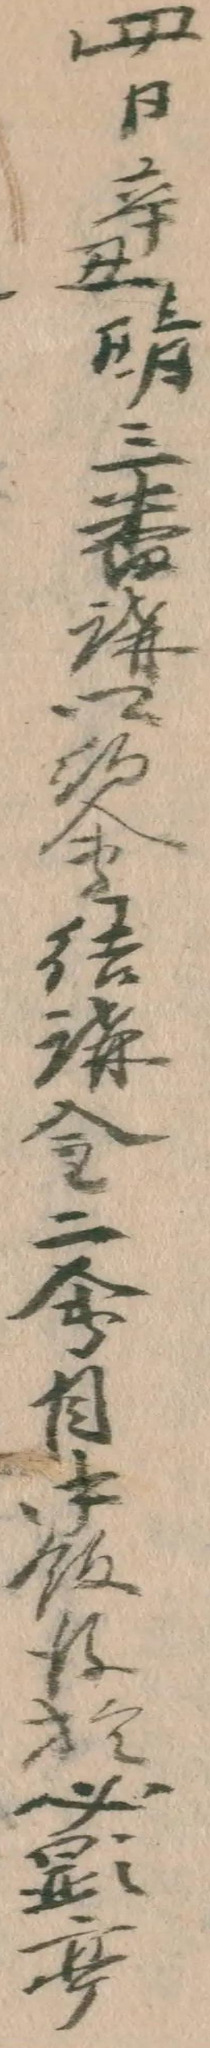四日辛丑晴三番講郷約會結講金二會目中飯役於必顕亭
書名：賀茂社記録. 第69冊
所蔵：国立国会図書館 National Diet Library, JAPAN
